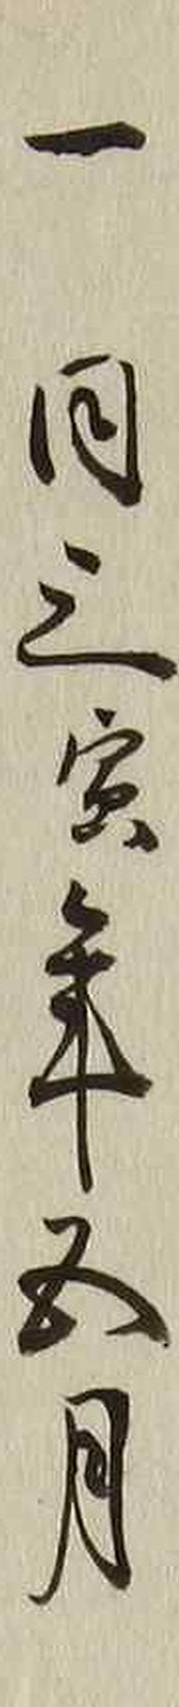一同三寅年五月
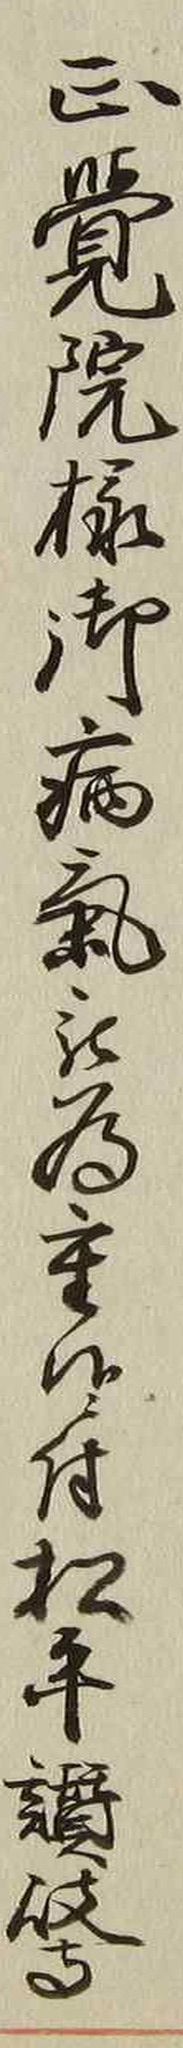正覚院様御病気被為重候ニ付松平讃岐守
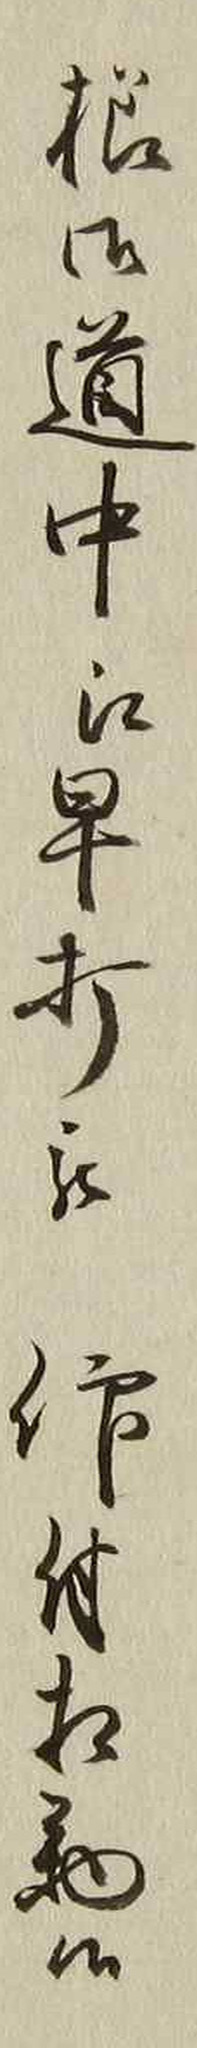様御道中江早打被仰付相勤候
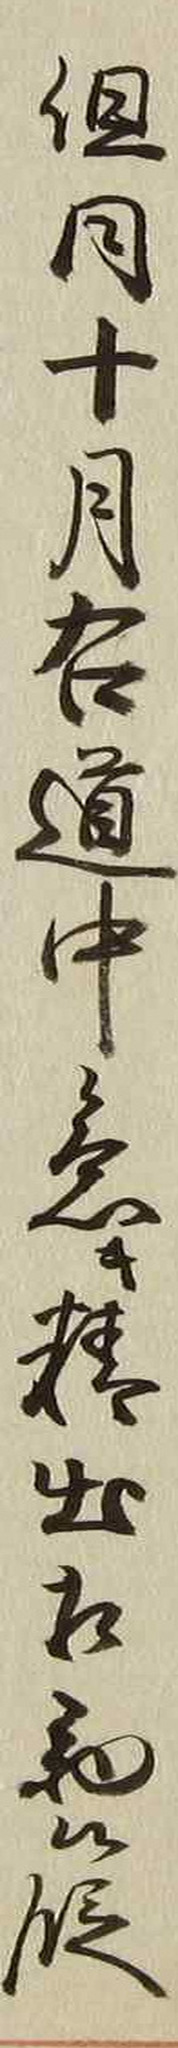但同十月右道中急キ精出相勤候段
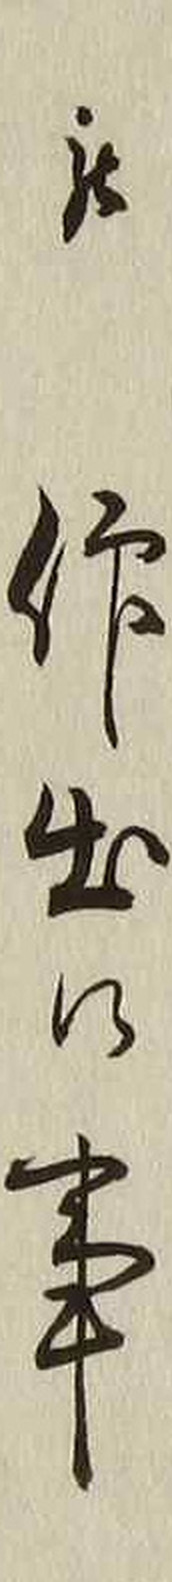被仰出候事
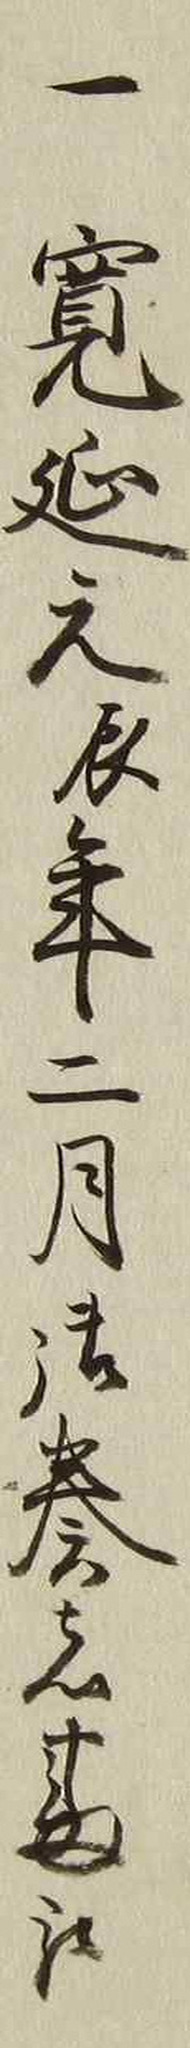一寛延元辰年二月御奏者番被
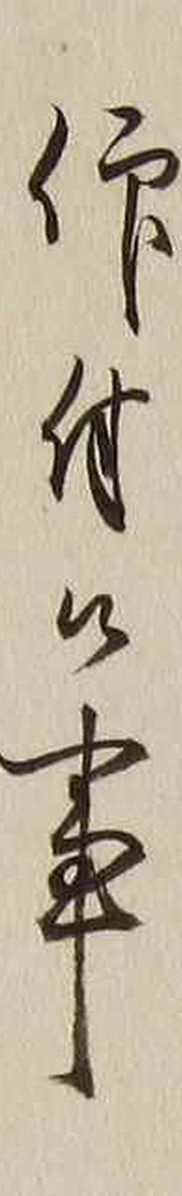仰付候事
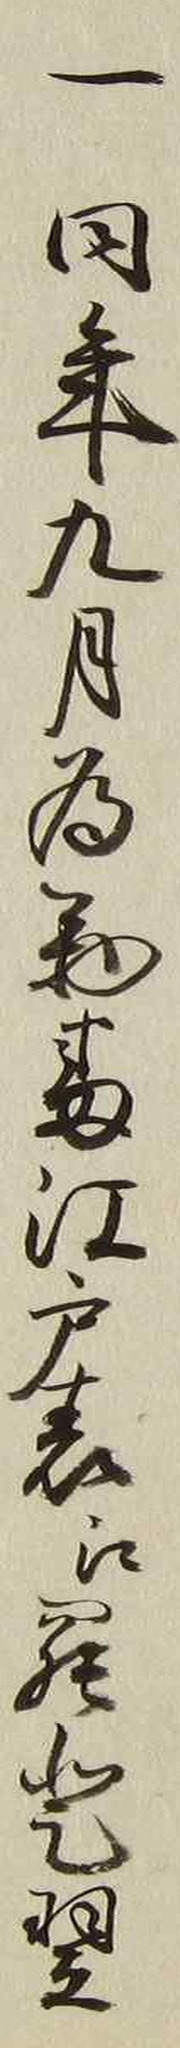一同年九月為勤番江戸表江罷登翌
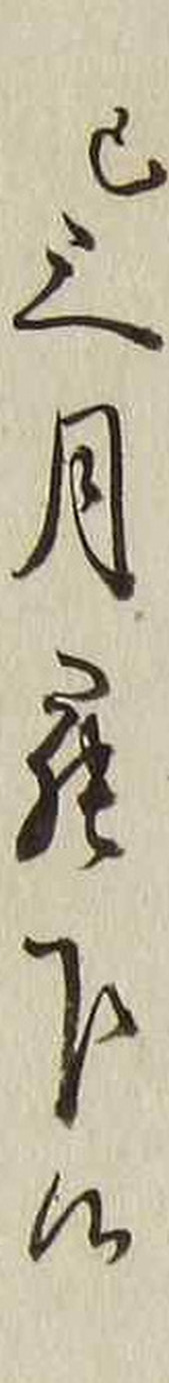巳三月罷下候
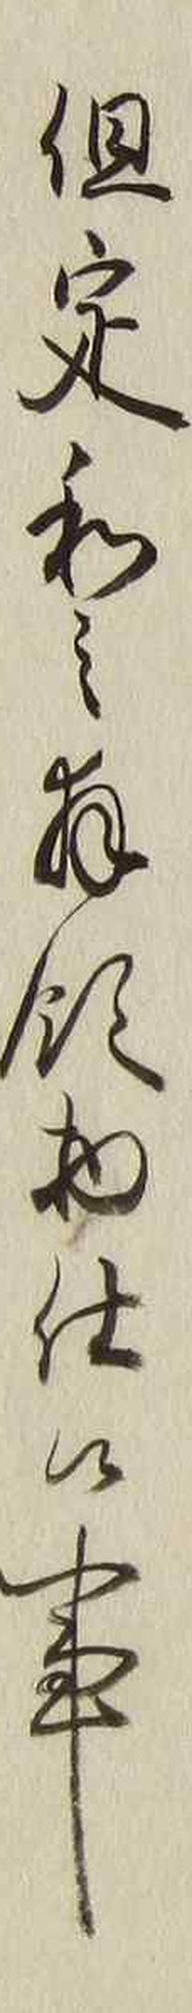但定和之拝領物仕候事
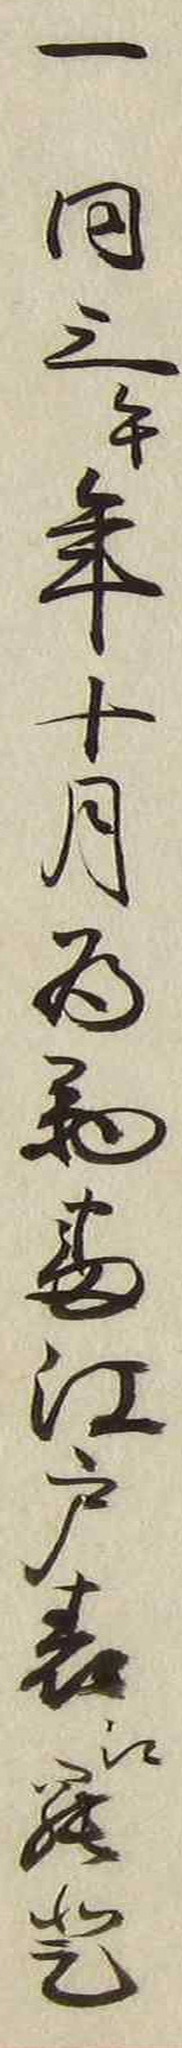一同三午年十月為勤番江戸表江罷登

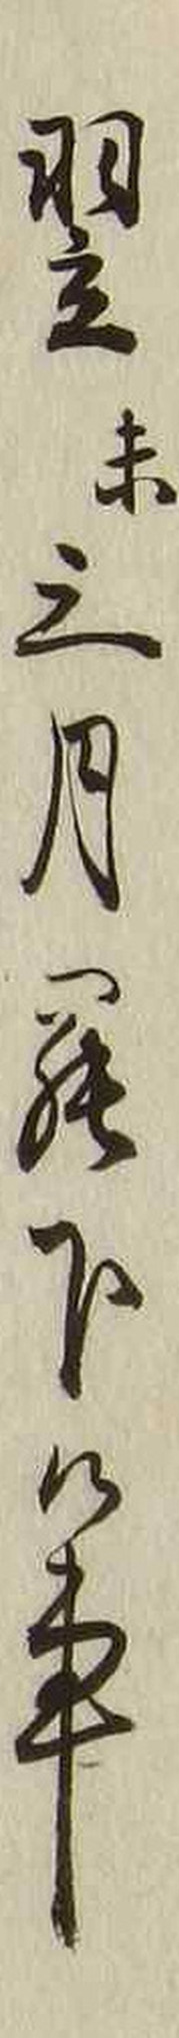翌未三月罷下候事
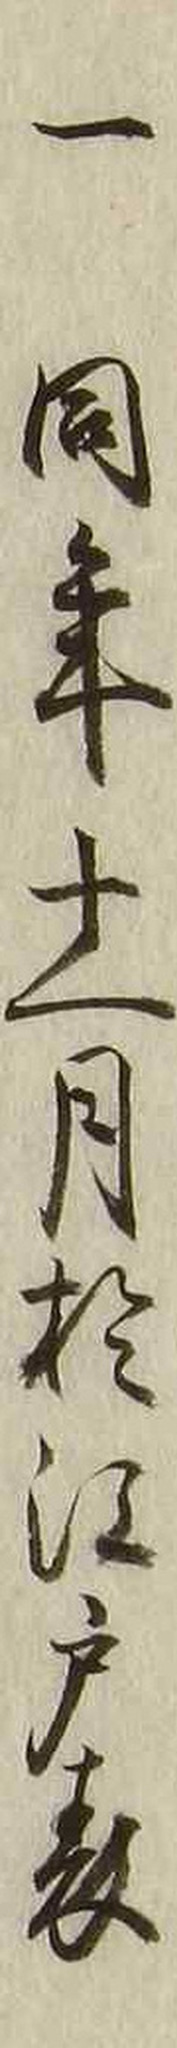一同年十一月於江戸表
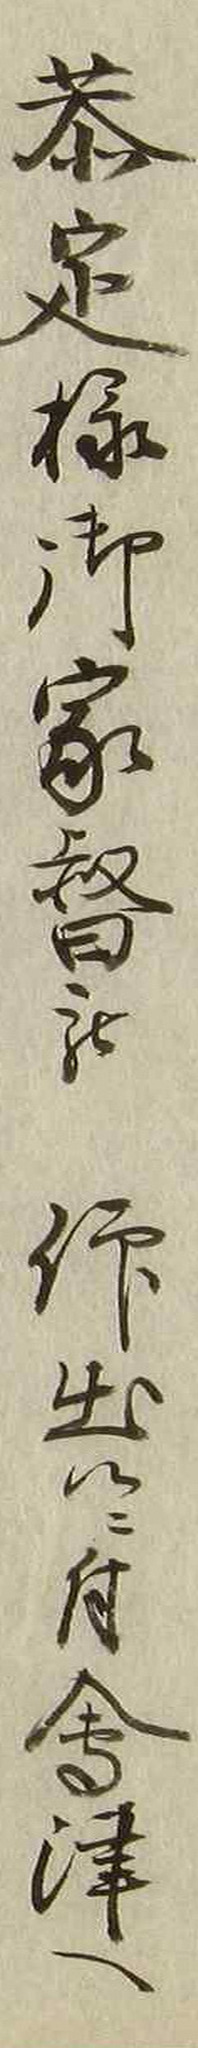恭定様御家督被仰出候ニ付会津へ
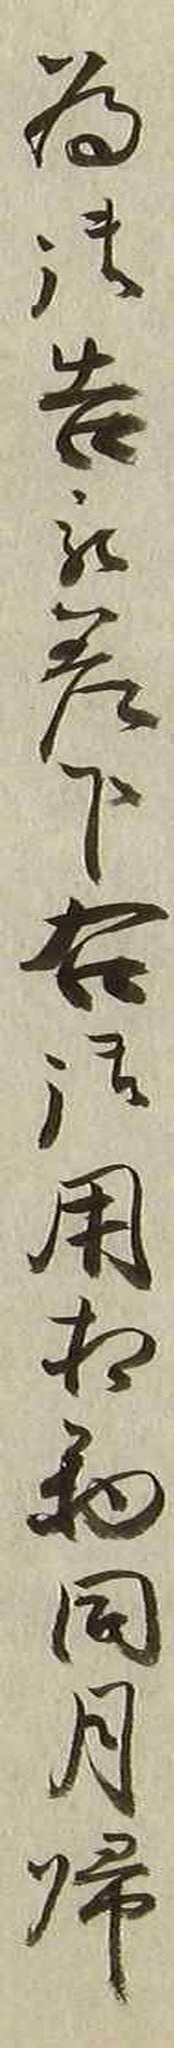為御告被差下右御用相勤同月帰
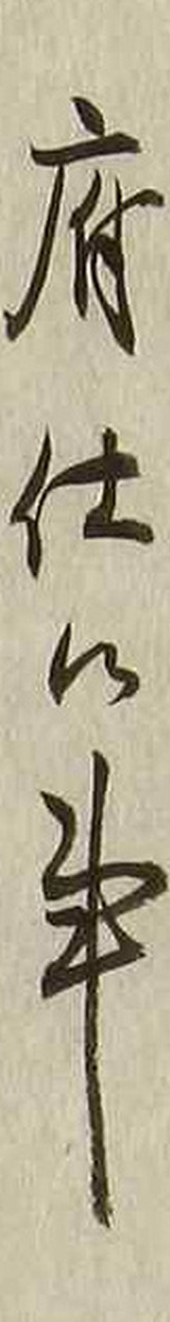府仕候事
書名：諸士系譜　巻之15　い之部15
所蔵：会津若松市立会津図書館
